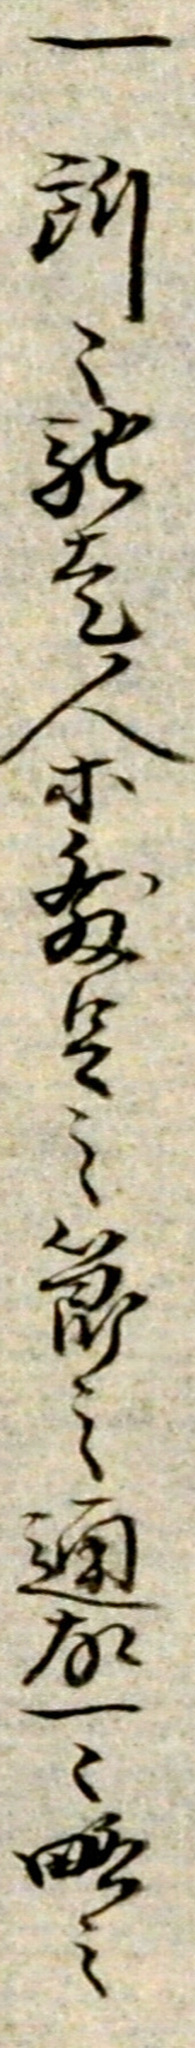一所々馳走人等発足之節之通故一々略之
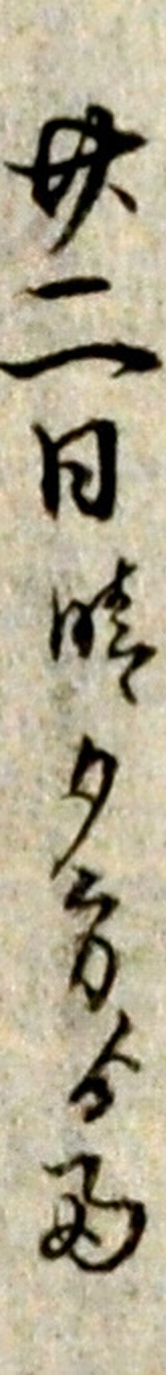廿二日晴夕方ゟ雨
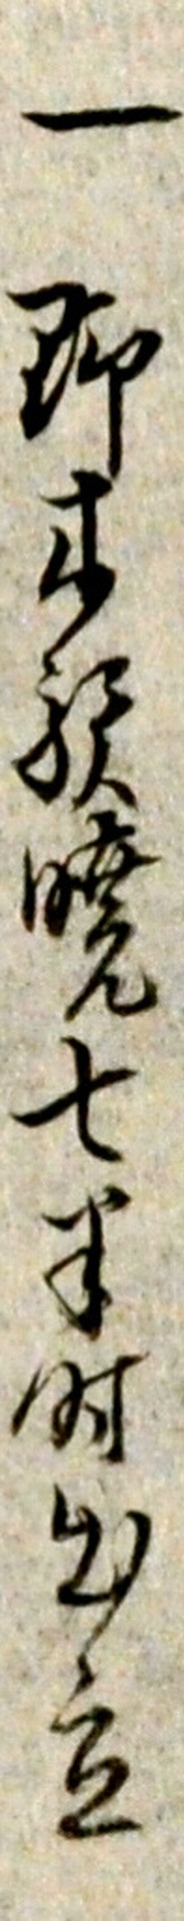一野木駅暁七半時出立
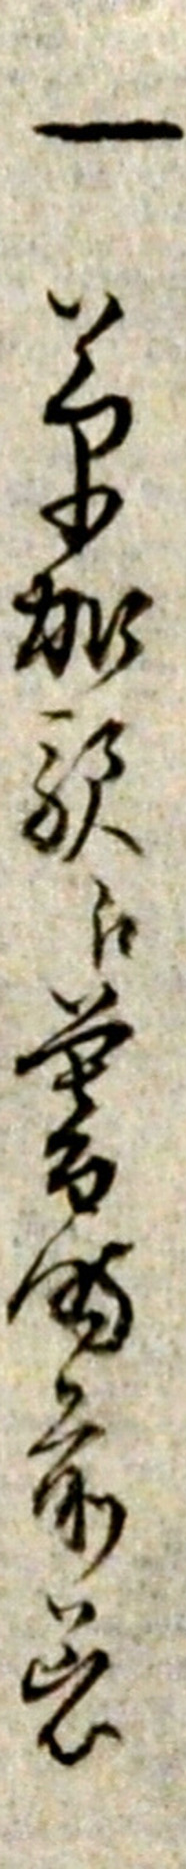一草加駅江暮時前着
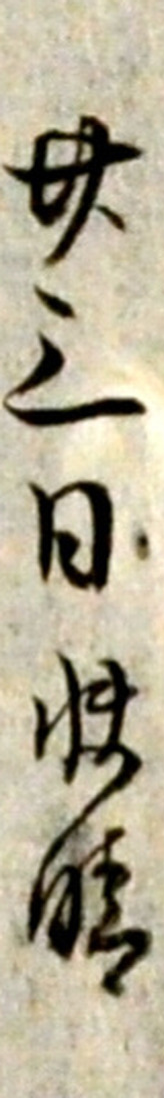廿三日快晴
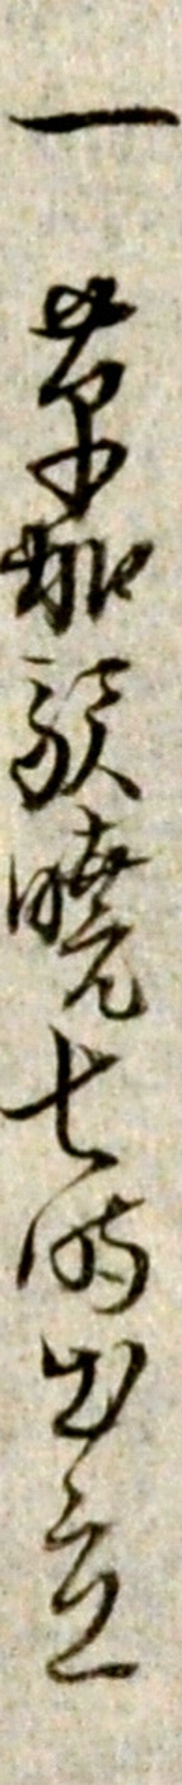一草加駅暁七時出立
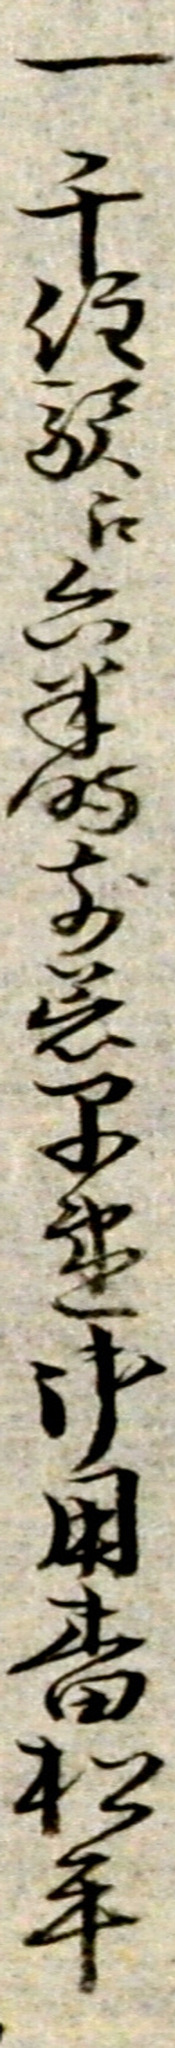一千住駅江六半時前着早速御用番松平
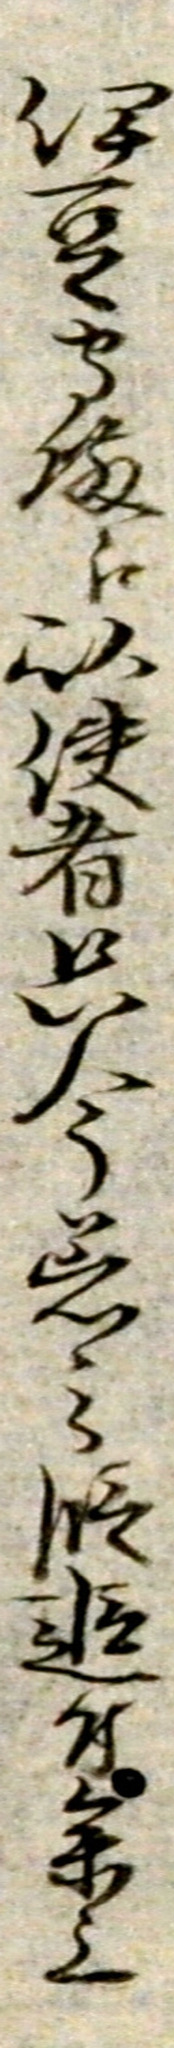伊豆守殿江以使者只今着之段追付参上
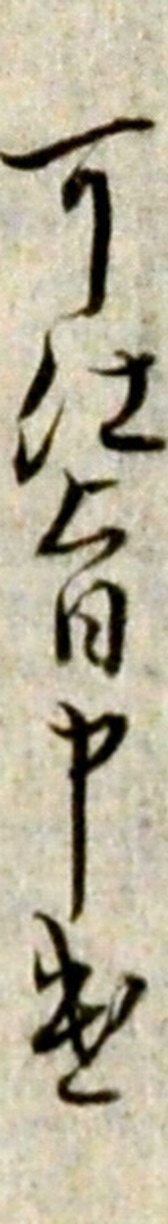可仕旨申遣
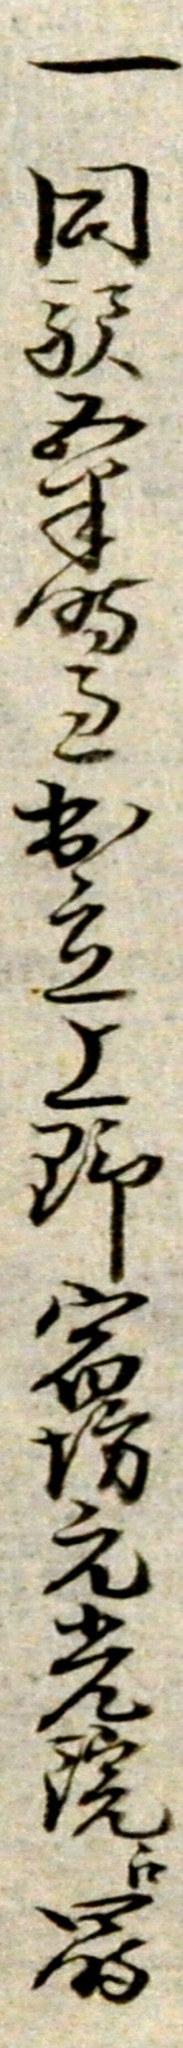一同駅五半時過出立上野宿坊元光院江四時

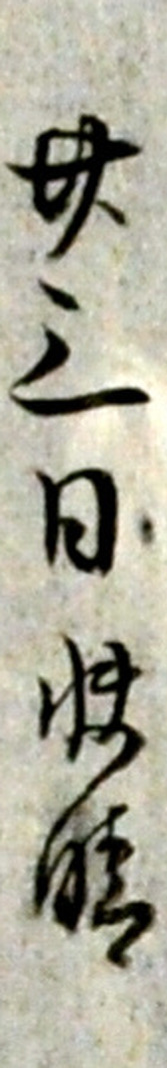廿三日快晴
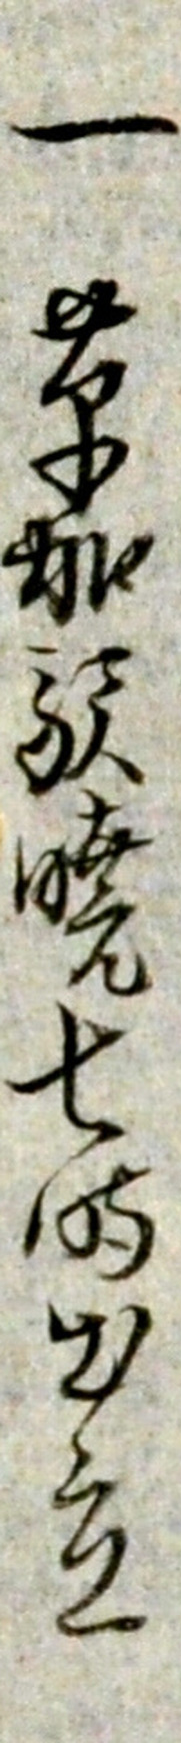一草加駅暁七時出立
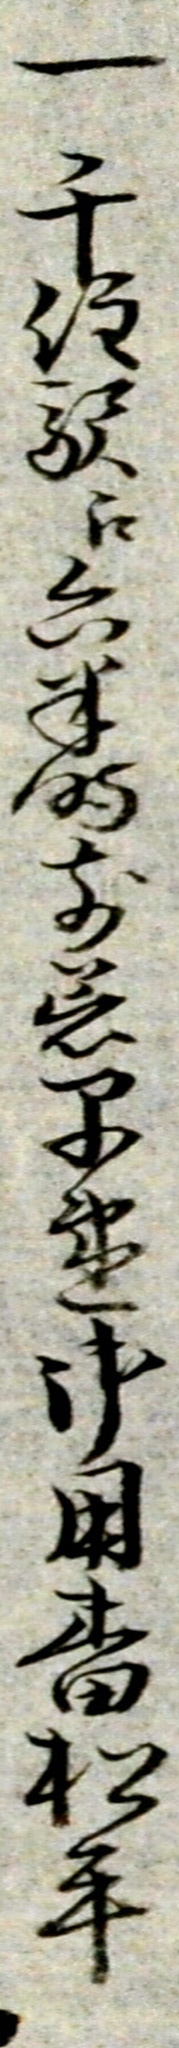一千住駅江六半時前着早速御用番松平
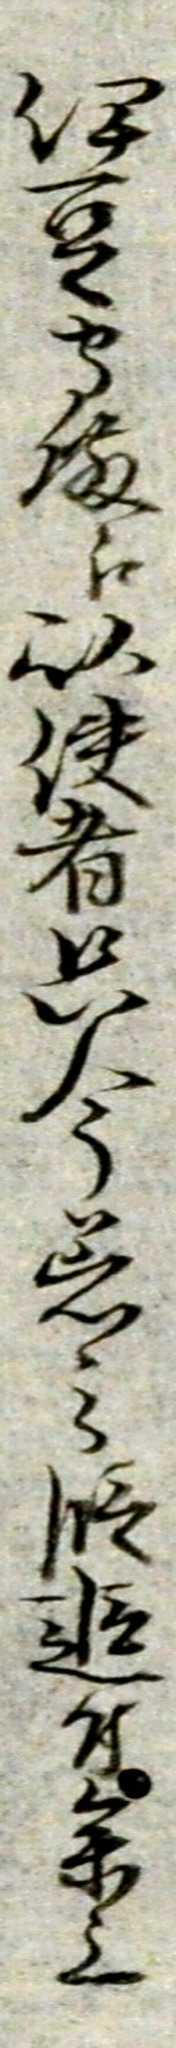伊豆守殿江以使者只今着之段追付参上
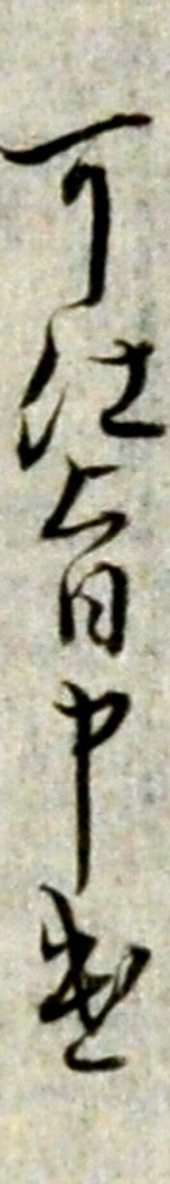可仕旨申遣
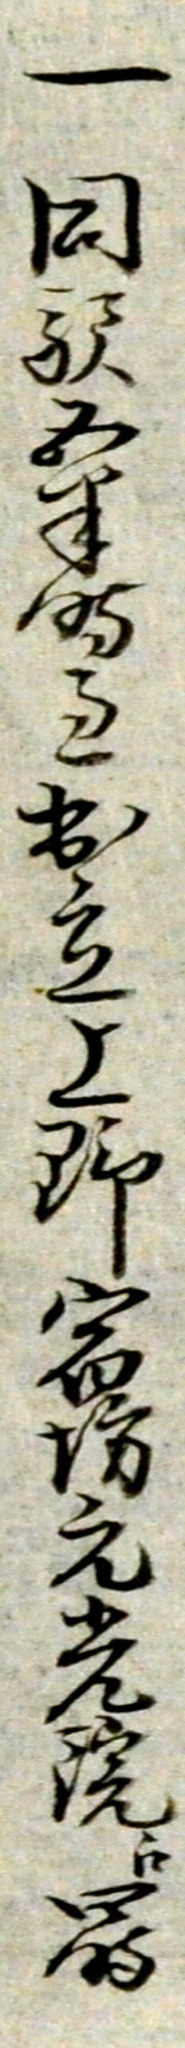同駅五半時過出立上野宿坊元光院江四時
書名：日光御名代相勤候節ノ留
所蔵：伊那市立高遠町図書館・合同会社AMANE
